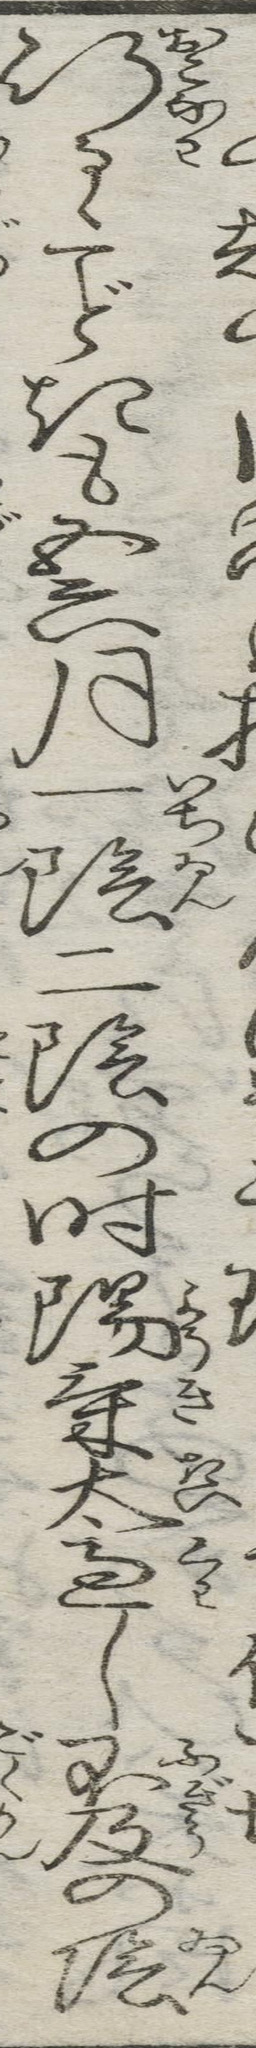行るるごときも五六月一陰二陰の時陽気太過し不及の陰
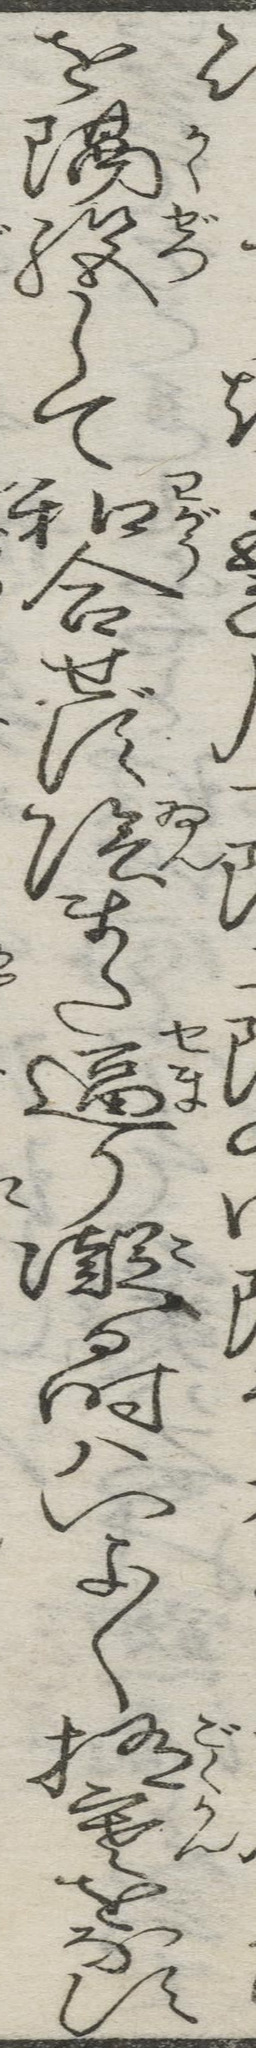を隔絶して和合せず陰また逼り凝る時はいよいよ極寒をなす
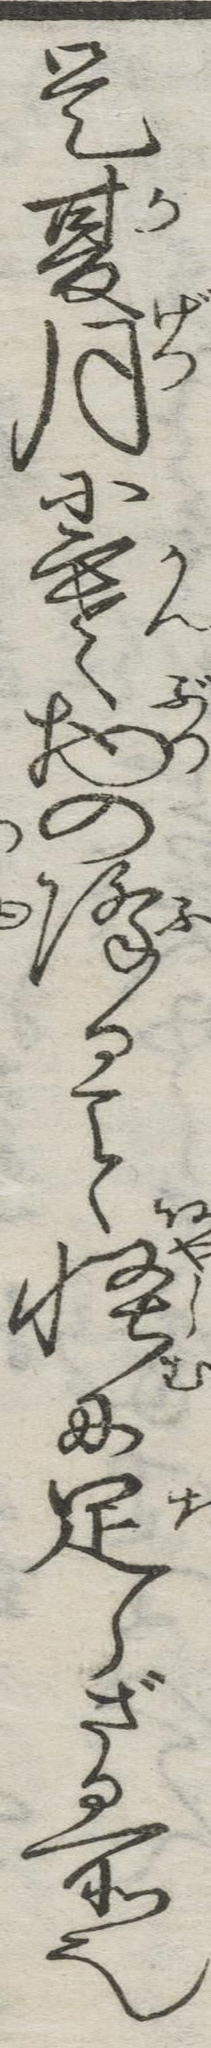是夏月に寒物の降ること怪に足らざる所也
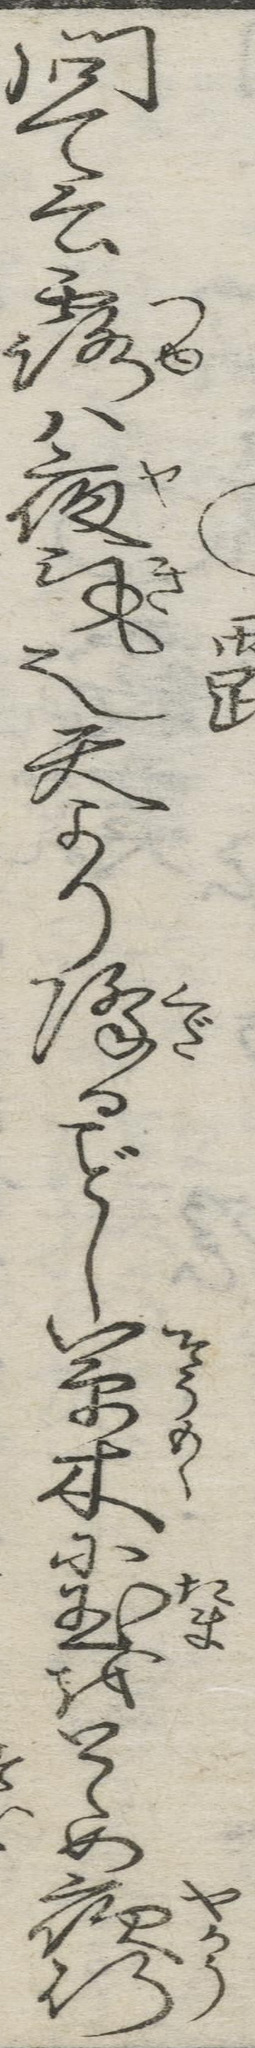問て云露は夜気也天より降るごとし草木に玉をとめ夜行
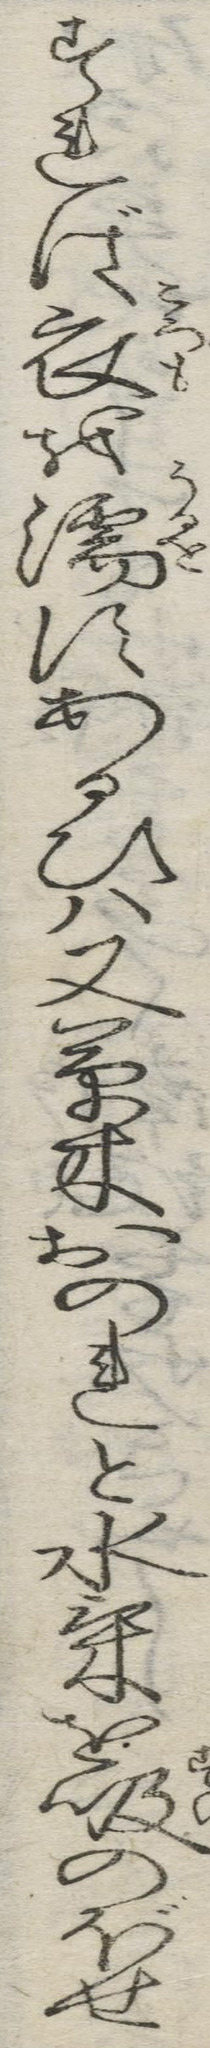すれば衣を濡すあるひは又草木おのれと水気を吸のぼせ
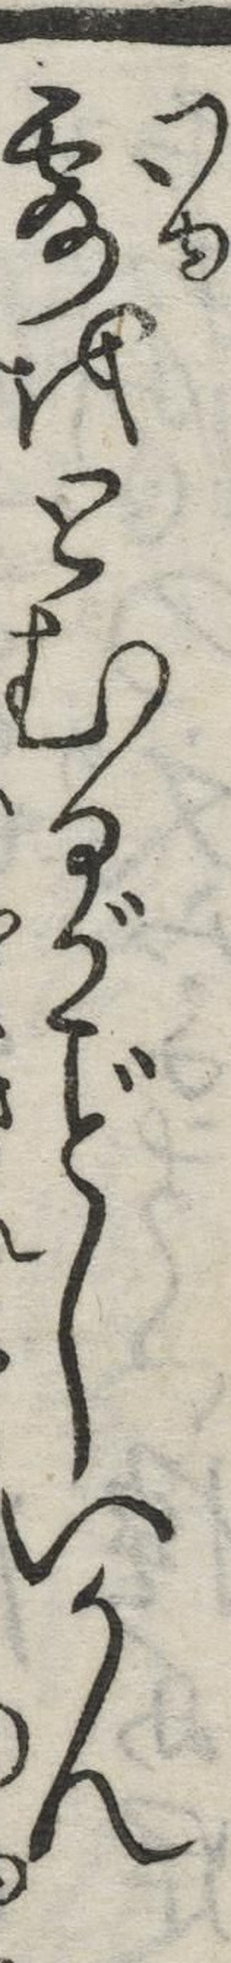露をとむるがごとしいかん
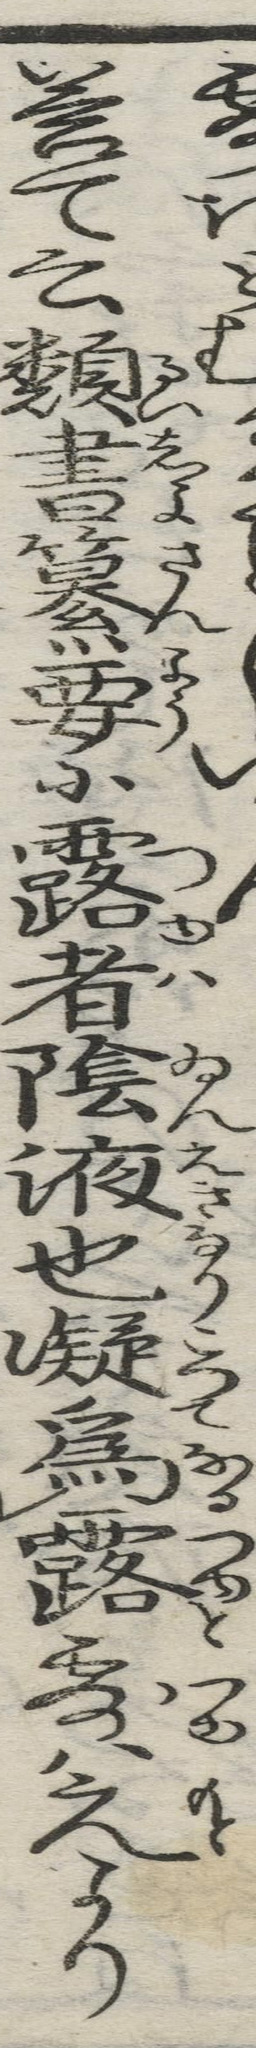答て云類書纂要に露者陰液也凝為露露は元より
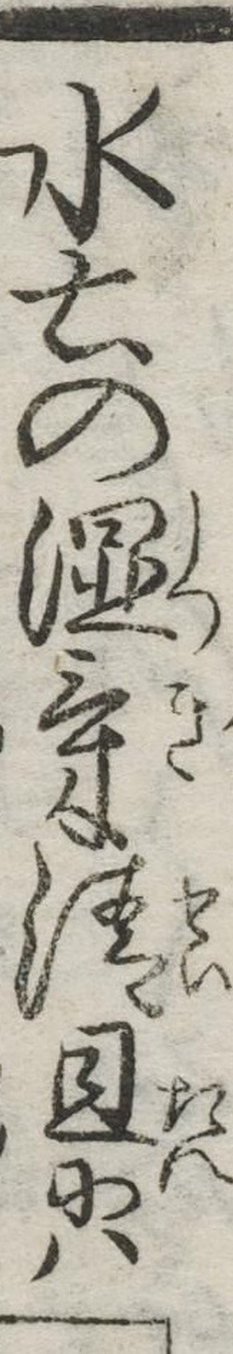水土の湿気清旦には
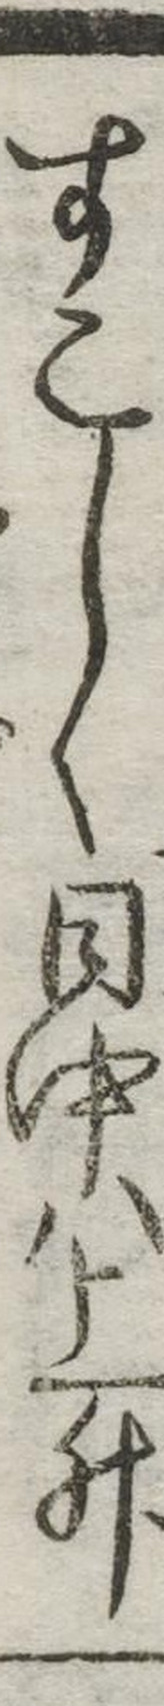すこしく日中は上昇
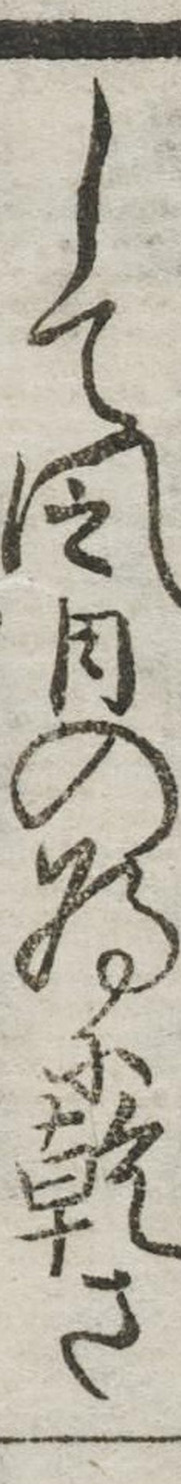して風日の物に乾さ
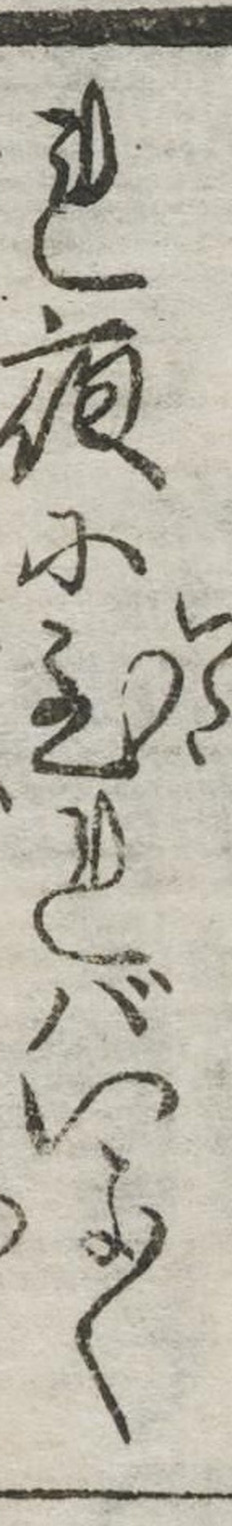れ夜に至ればいよ〳〵
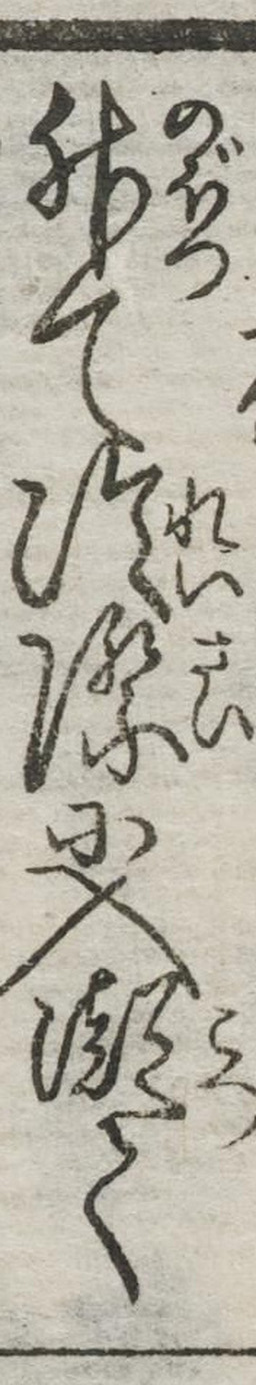升て冷際に入凝て
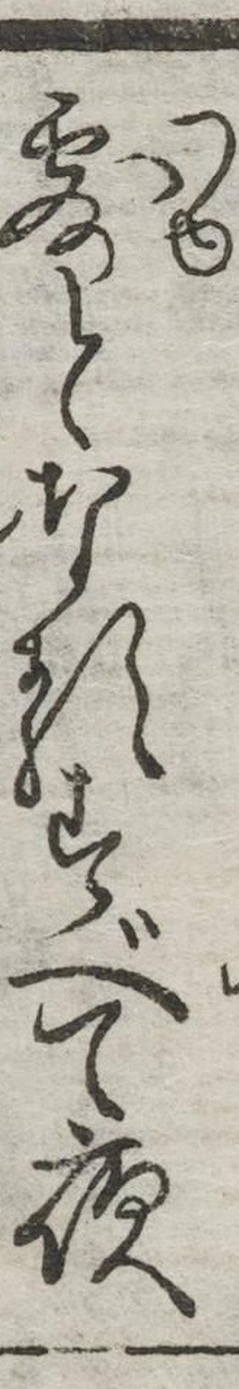露となるすべて夜
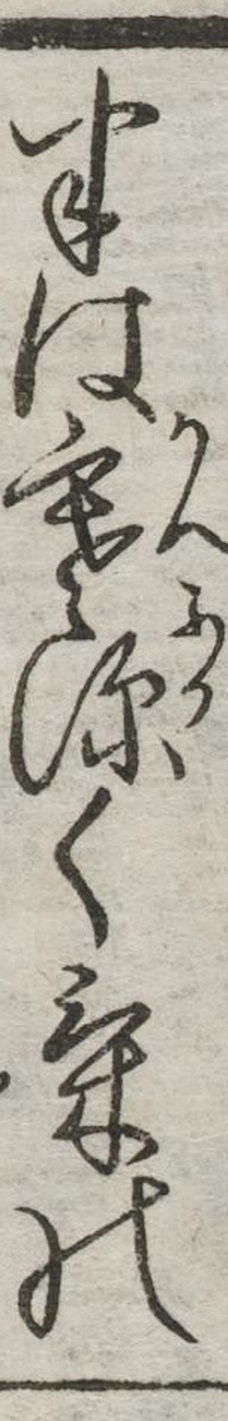半は寒深く気の
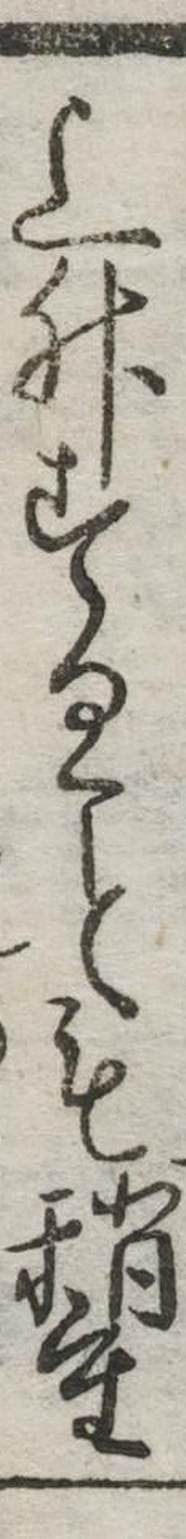上升することも稍重
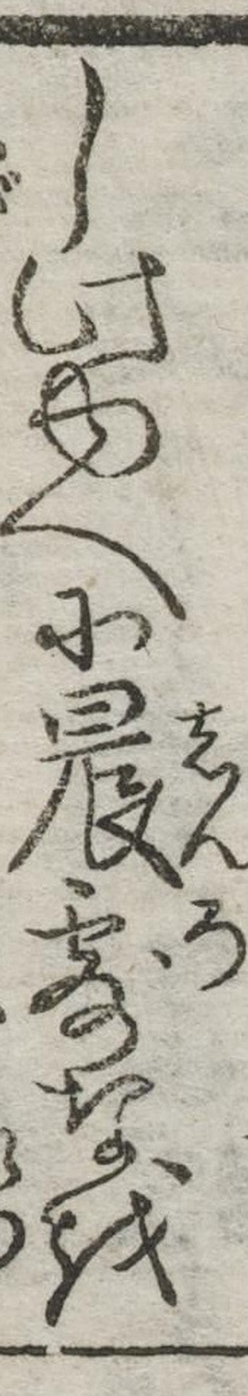し此ゆえに晨露なを
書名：訓蒙天地辨　地
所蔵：東京大学地震研究所図書室 Earthquake Research Institute Library, The University of Tokyo, JAPAN
